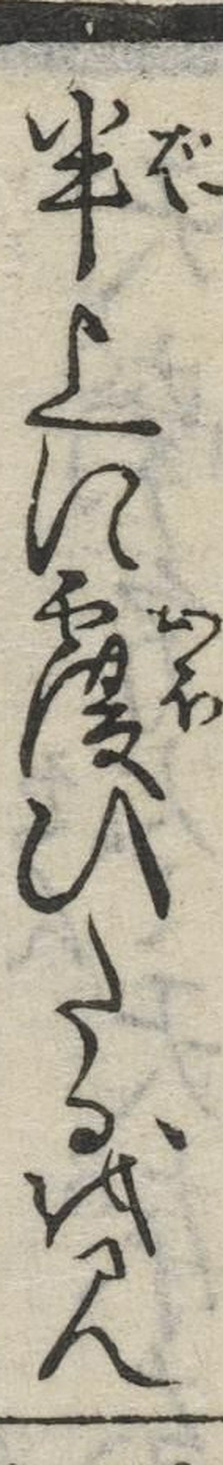半上に覆ひたるを見
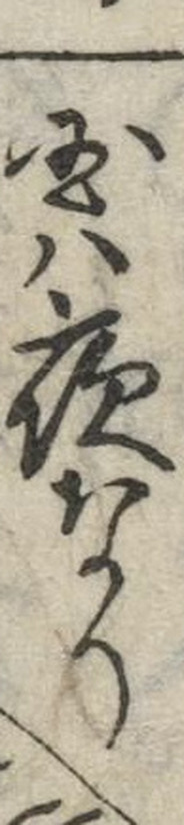国は夜なり
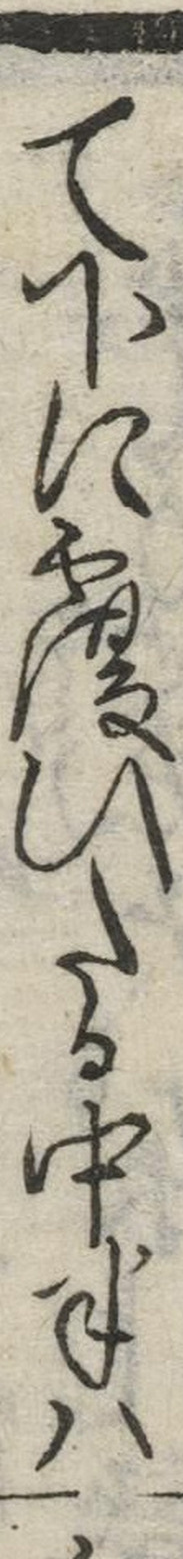て下に覆ひたる中半は
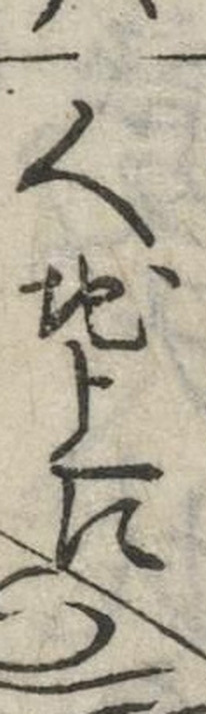人地上に
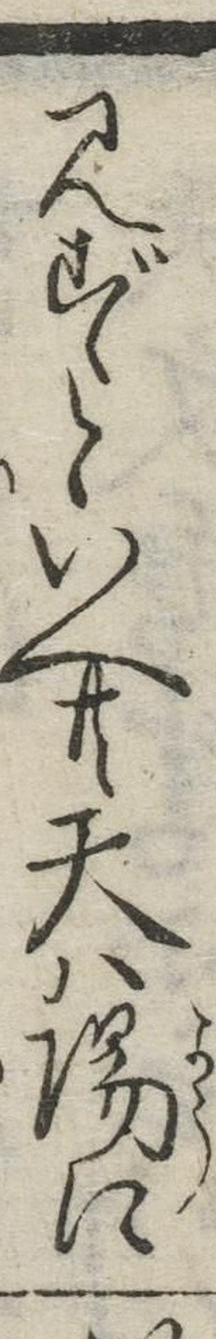見ずといへ共天は陽に
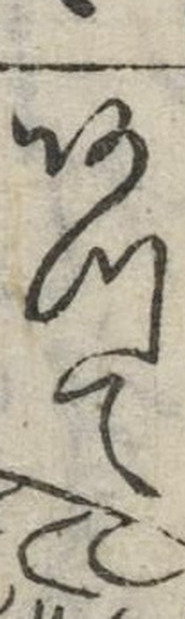あつて
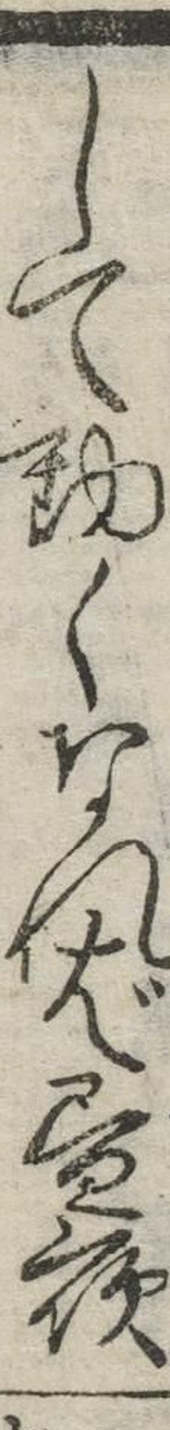して動くなれば昼夜
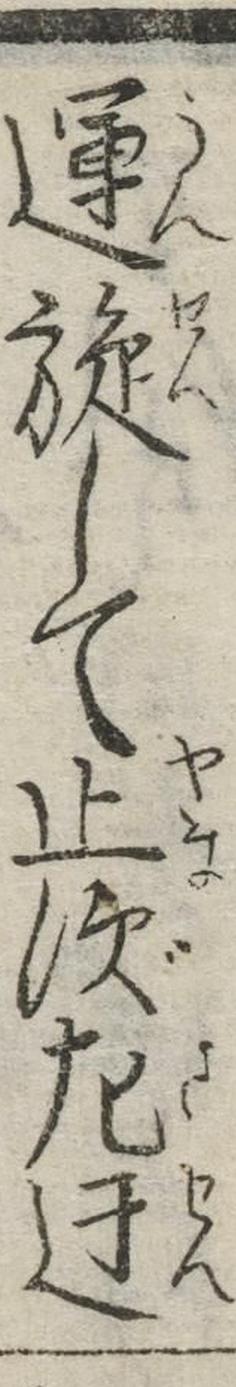運旋して止ず左迂
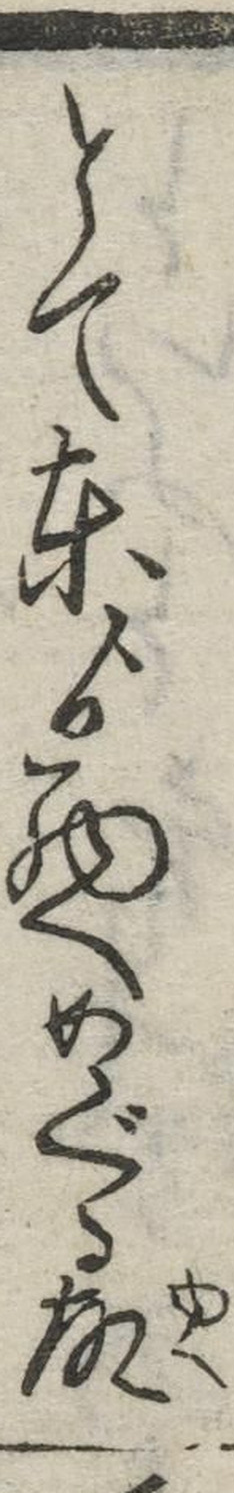とて東ゟ西へめぐる故
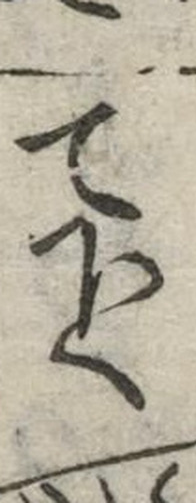て下へ
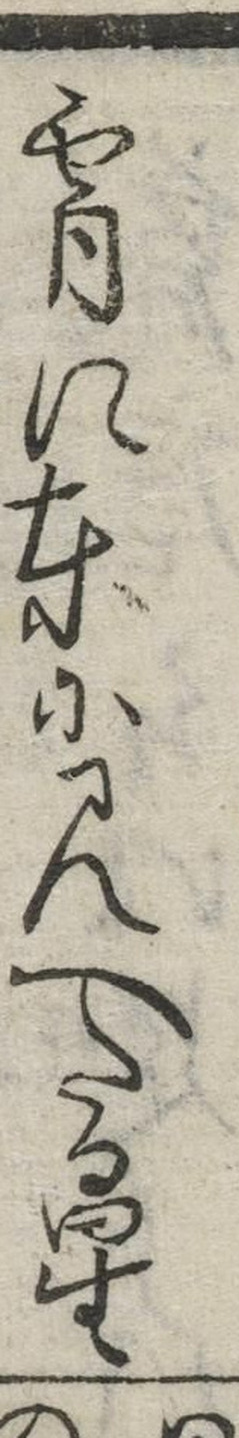宵に東に見へたる星
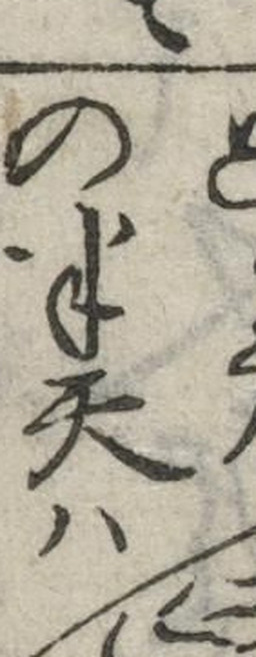の半天は
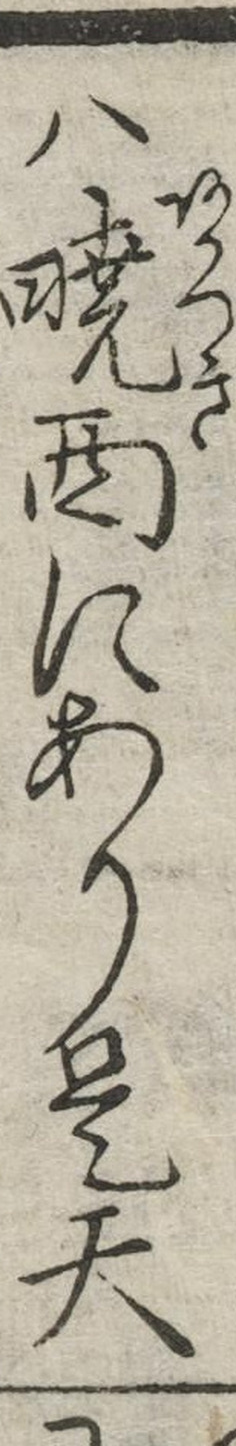は暁西にあり是天
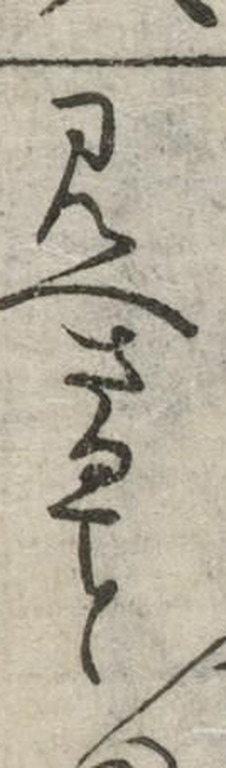見へさること
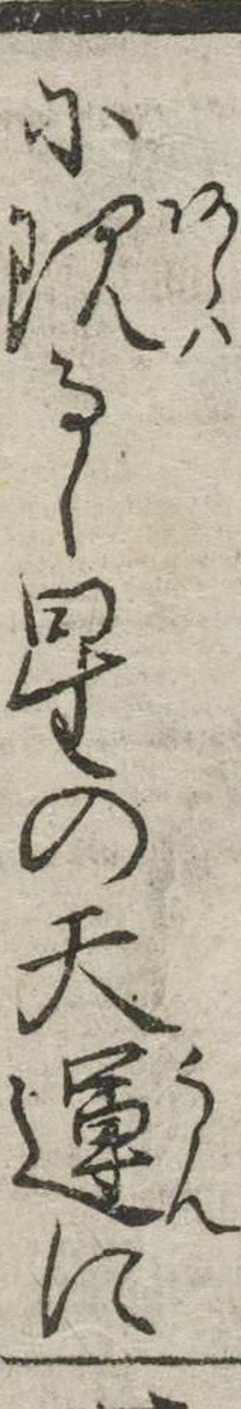に現るゝ星の天運に
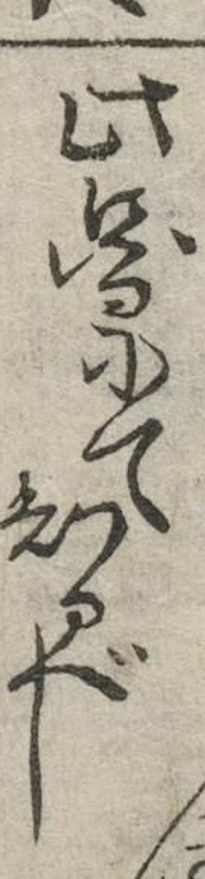此図にて知るべし
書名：訓蒙天地辨　天
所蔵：東京大学地震研究所図書室 Earthquake Research Institute Library, The University of Tokyo, JAPAN
